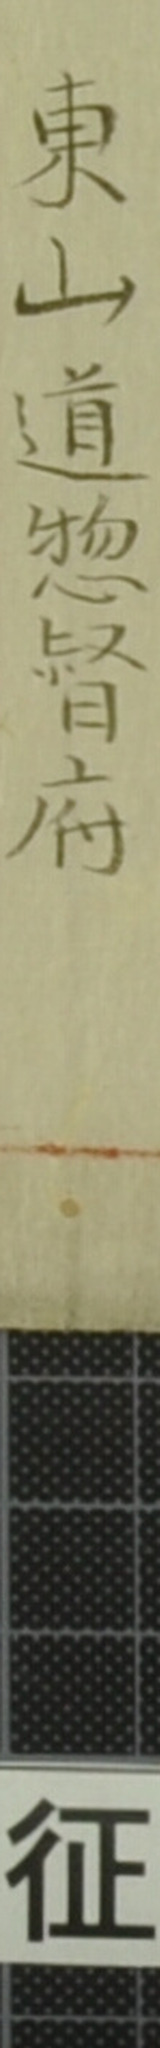東山道惣督府
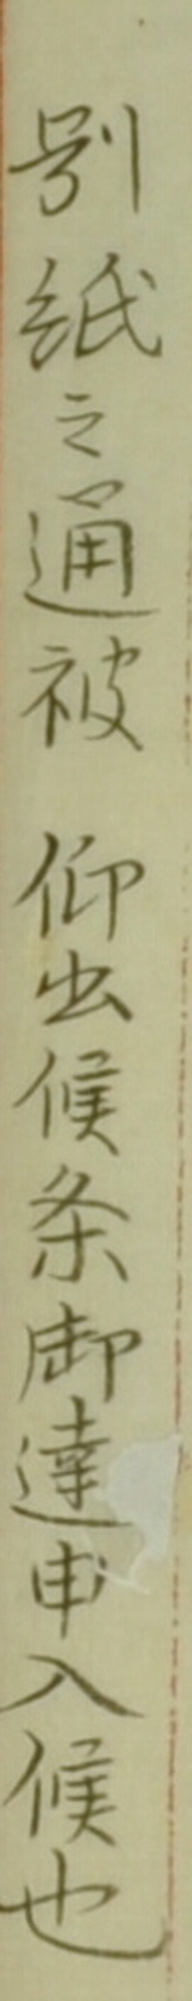別紙之通被仰出候条御達申入候也
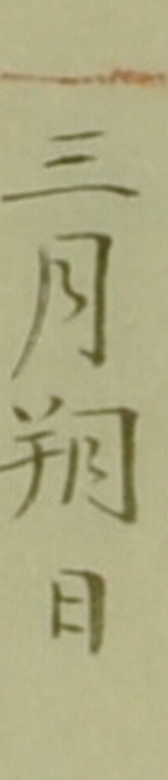三月朔日
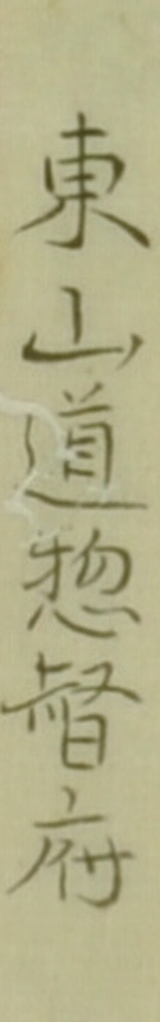東山道惣督府
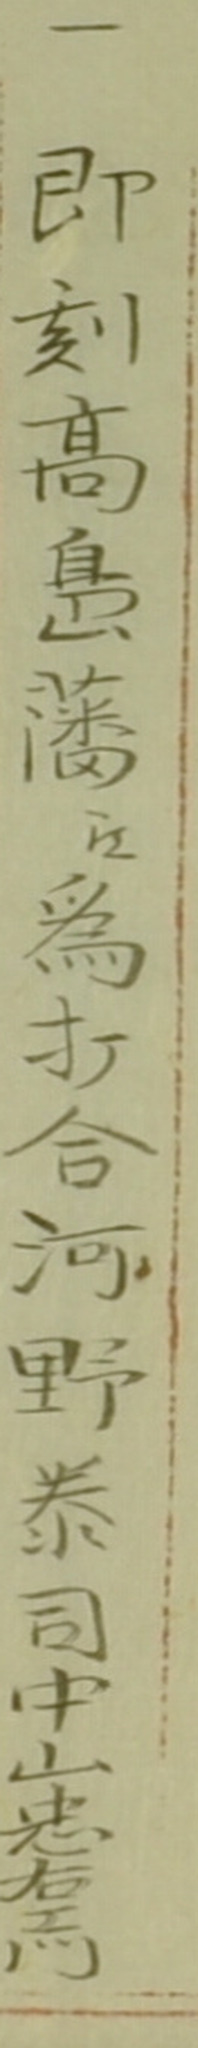一即刻高島藩江為打合河野泰司中山忠右衛門
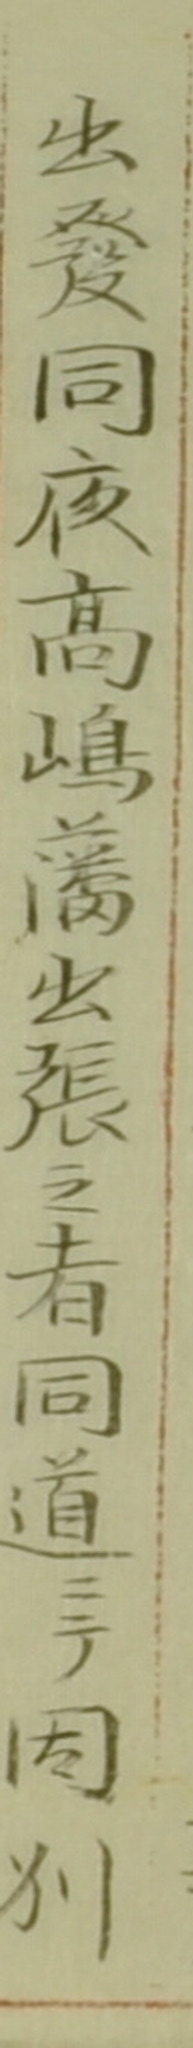出発同夜高嶋藩出張之者同道ニテ因州
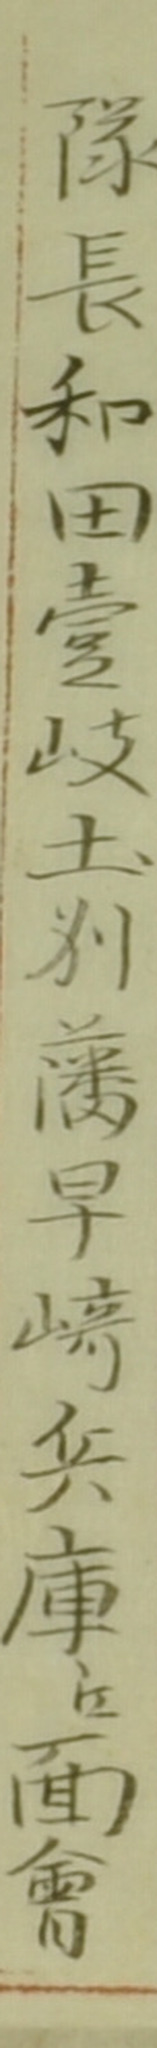隊長和田壱岐土州藩早崎兵庫江面會
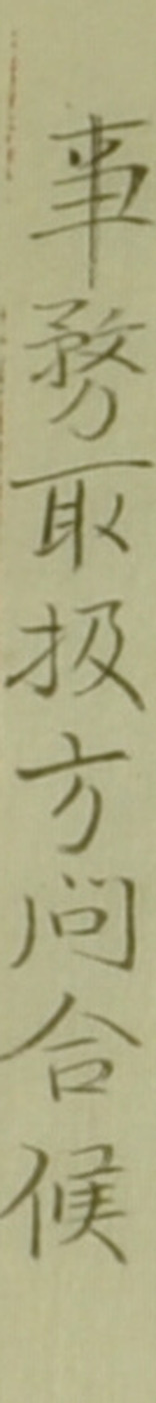事務取扱方問合候
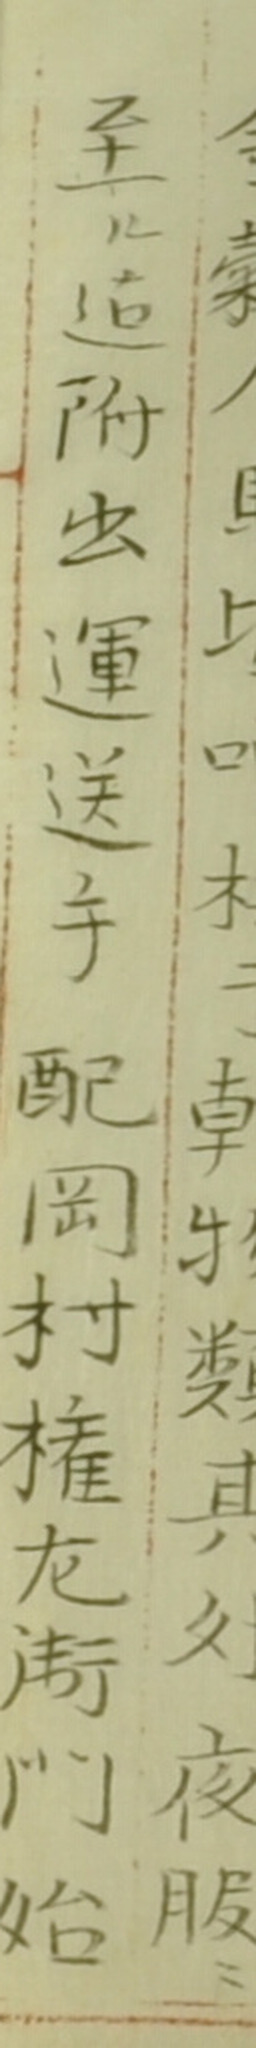至ル迄附出運送手配岡村権左衛門始

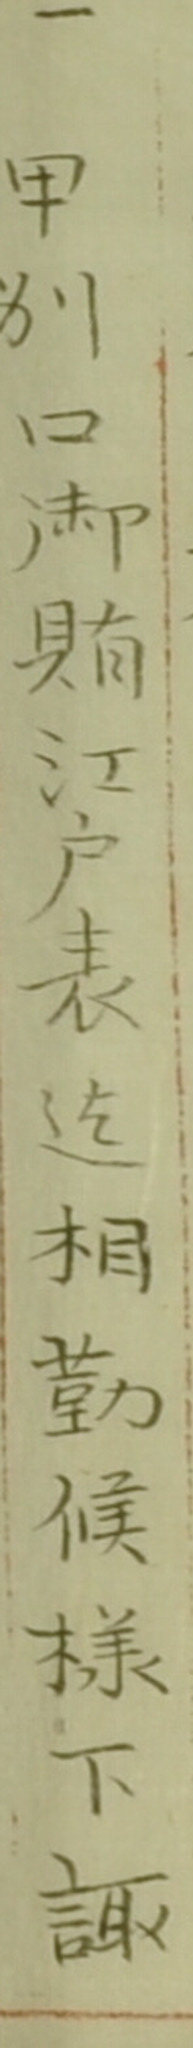一甲州口御賄江戸表迄相勤候様下諏
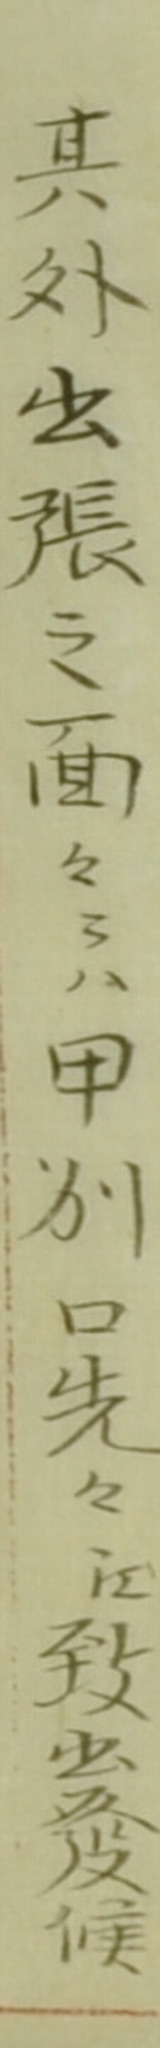其外出張之面々ニハ甲州口先々江致出発候
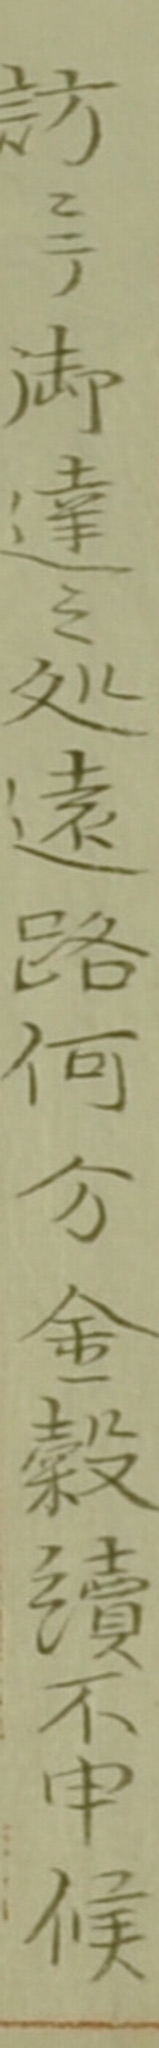訪ニテ御達之処遠路何分金穀続不申候
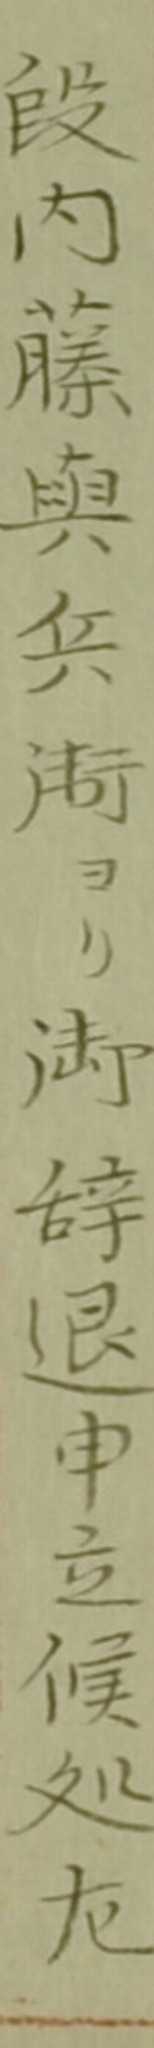段内藤與兵衛ヨリ御辞退申立候処左
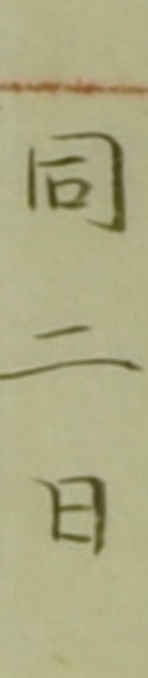同二日
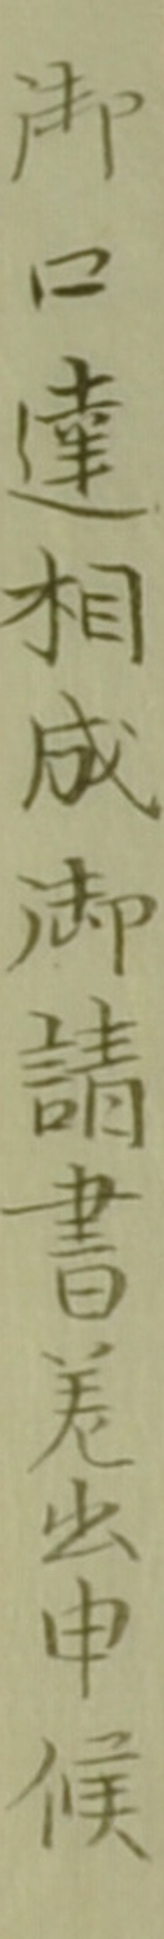御口達相成御請書差出申候
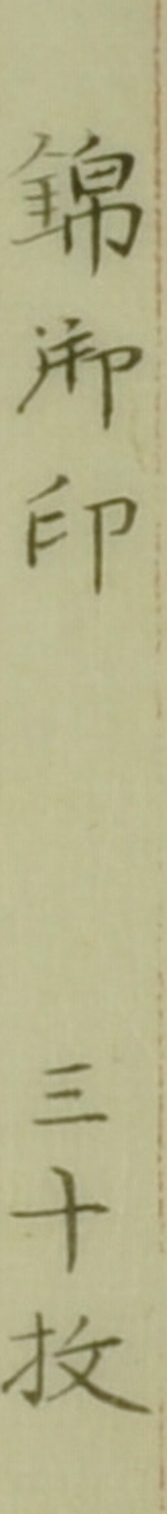錦御印三十枚
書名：御東征ニ付甲州口兵食人馬御賄之事件（控）
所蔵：伊那市立高遠町図書館・合同会社AMANE
